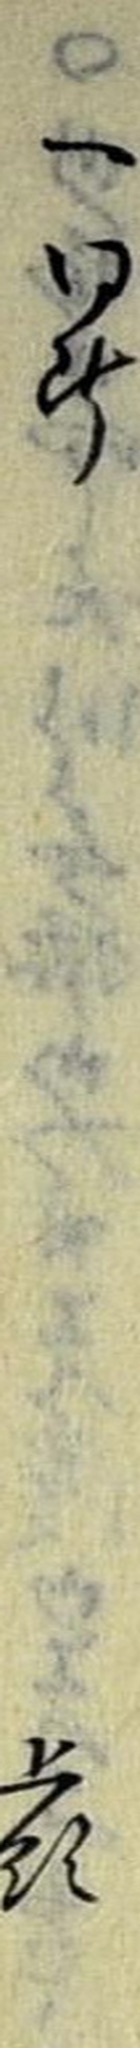一同断上領
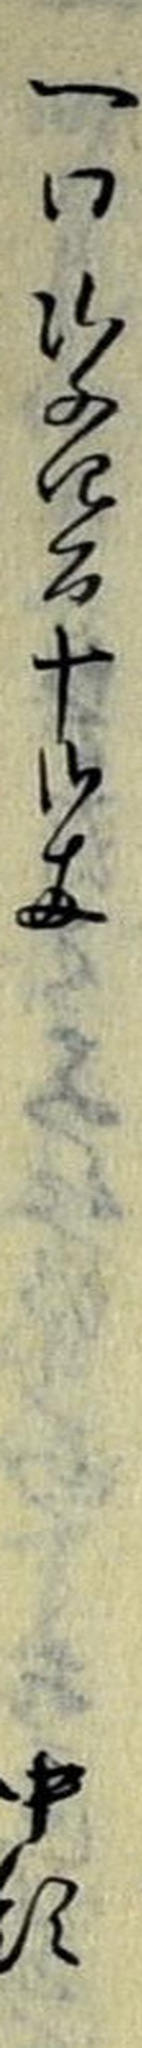一同弐千四百十弐両中領
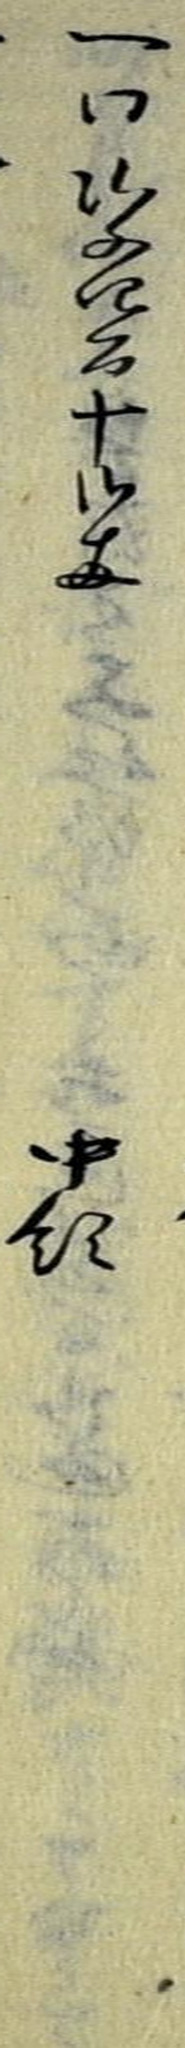一同弐千四百十弐両中領
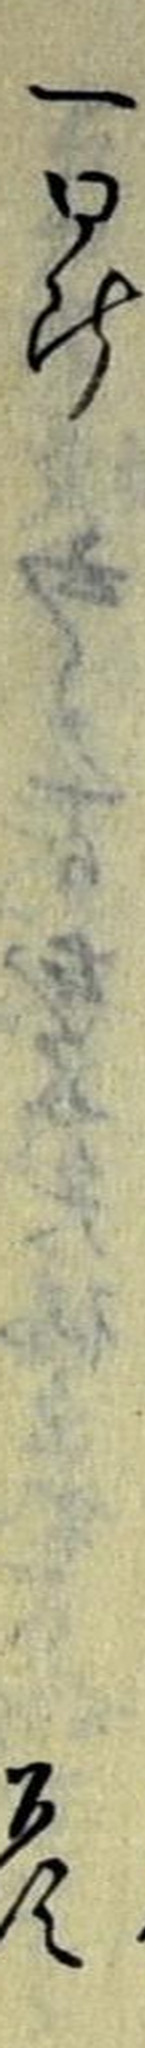一同断下領
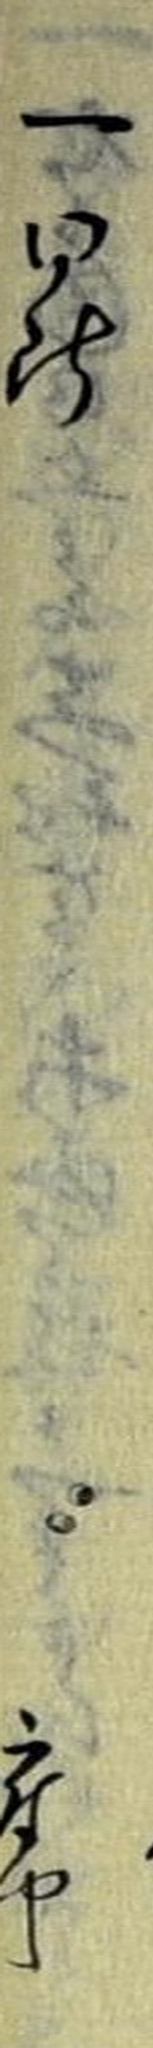一同断府中
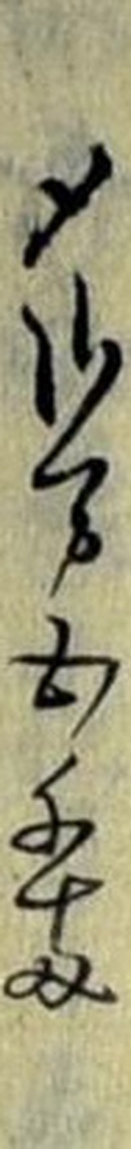〆弐万五千両
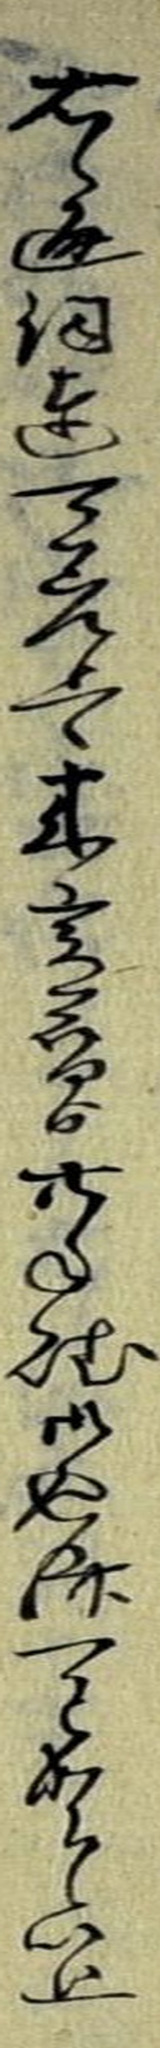右之通調達可差上候来亥暮ゟ廿年賦御返済可被成下候以上
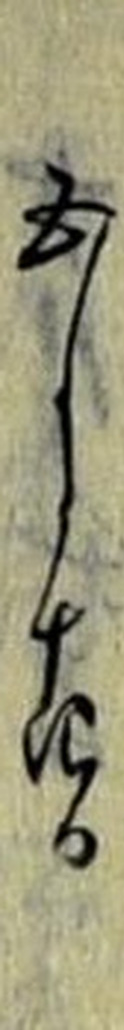五月十四日
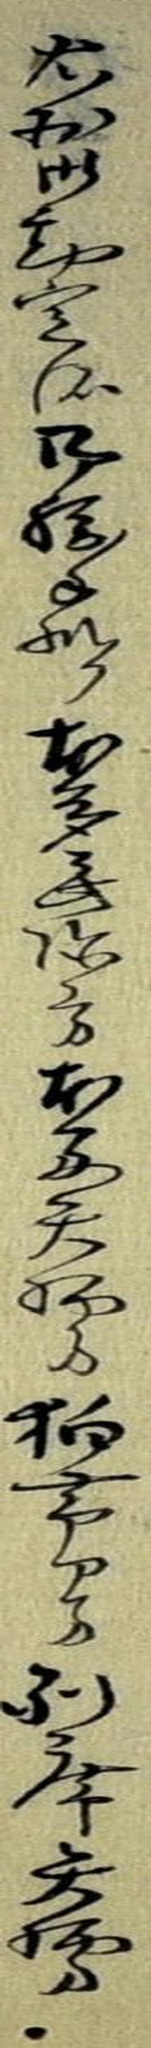右於御勘定所御勝手掛り本多民弥方本多矢柄方狛帯刀方列席矢柄方
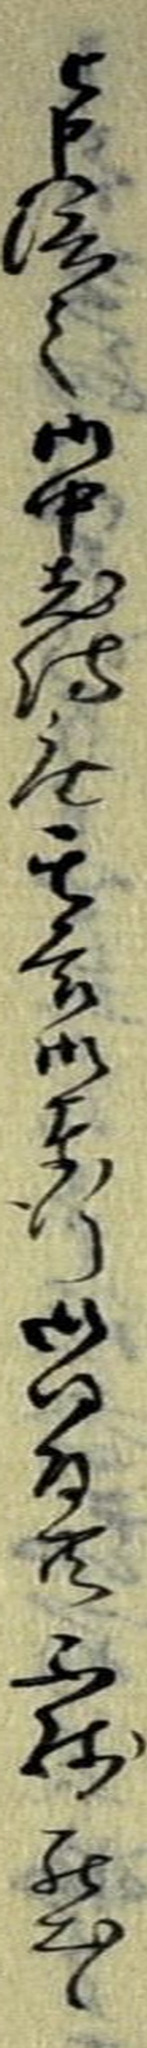被申渡之御中老侍座其節御奉行御目付共不残罷出候
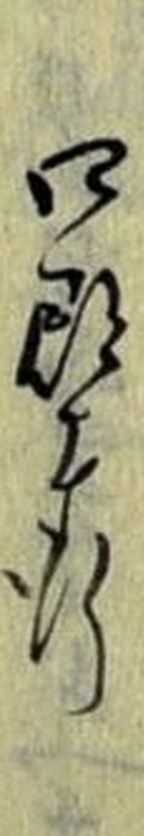四郡奉行
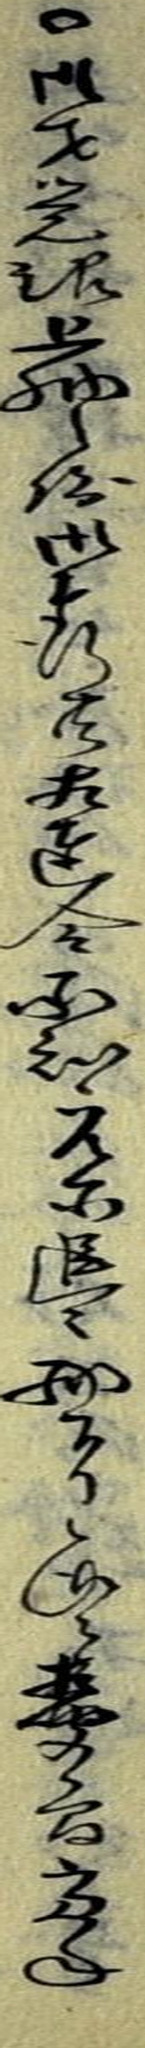〇御才覚銀上納之儀御奉行共へ相達令承知候乍尓追々納下り候趣に相聞候間当年
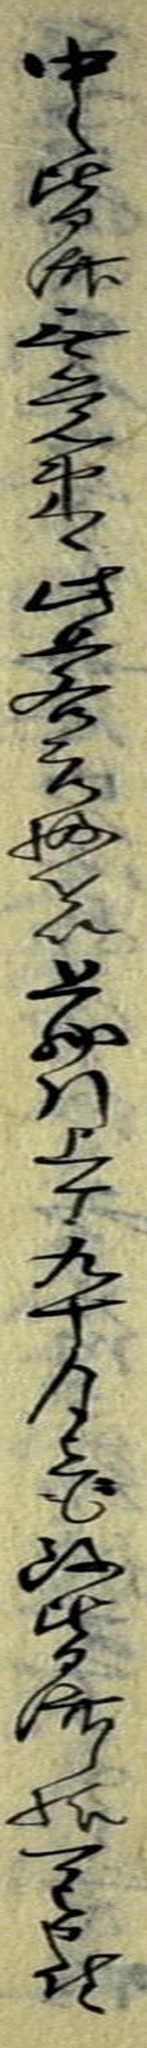中之皆済無覚束候此上各取扱を以上納引上ケ九十月迄にも致皆済候様可被申付候
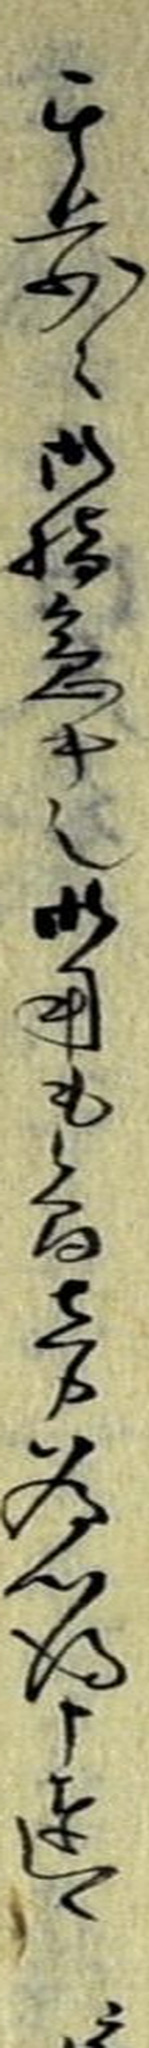其上少々御指急き之御用も候間為心得申達候府中も
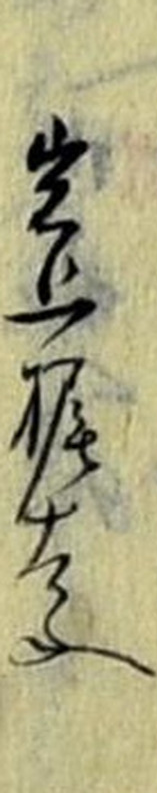岩上梶大夫
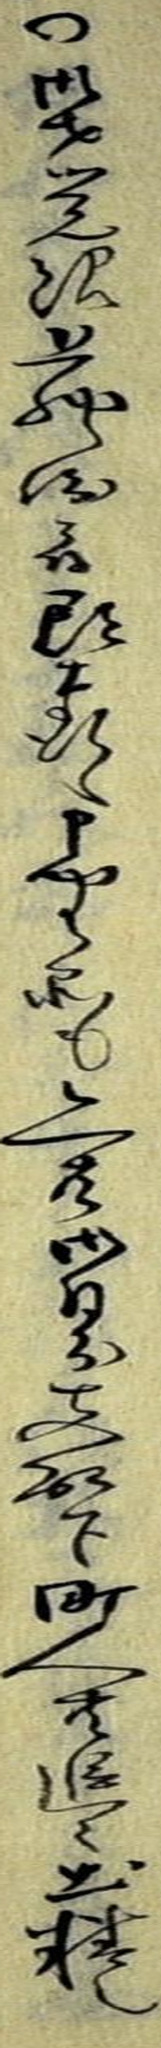〇御才覚銀上納之儀に付郡奉行へ申聞品も候へ共御自分支配下町人共追々出精之
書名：命令之部 二
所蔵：福井県文書館 Fukui Prefectural Archives
